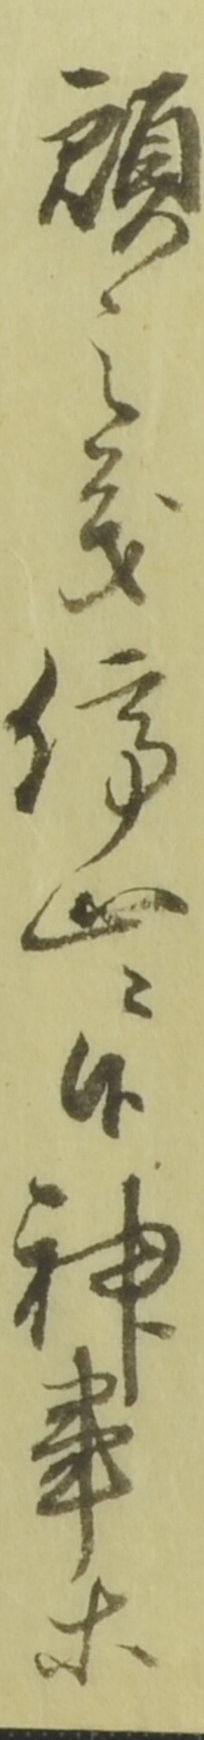願之義停止ニ候神事等
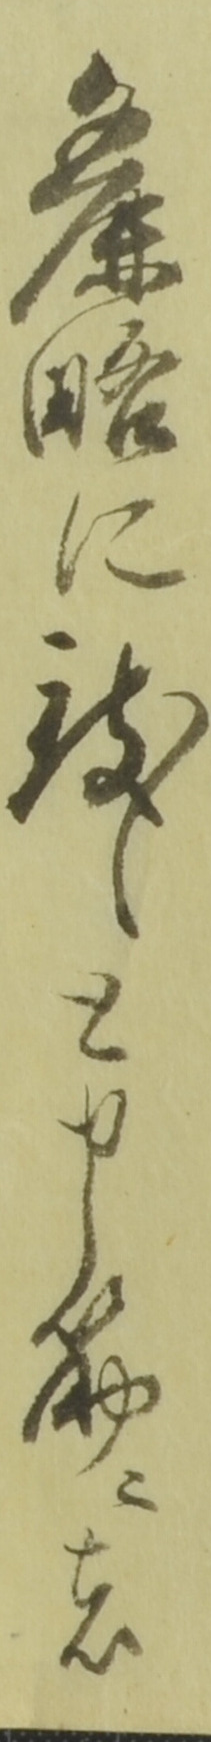粗略に致しと申筋ニは
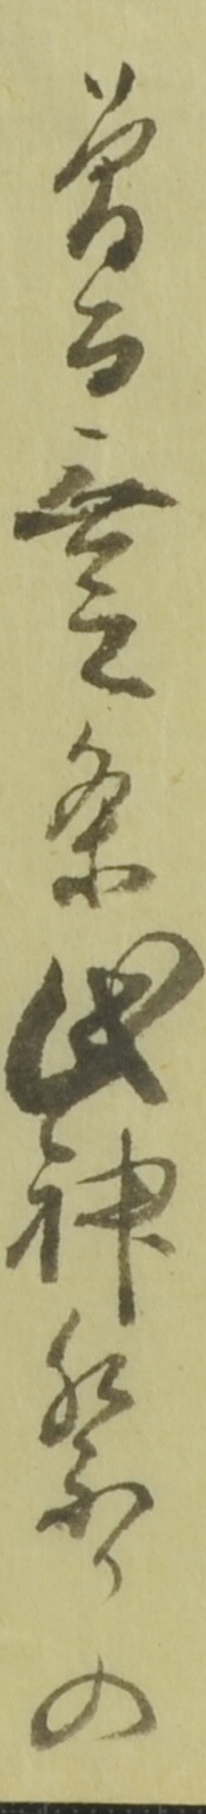曽而無之条氏神祭りの
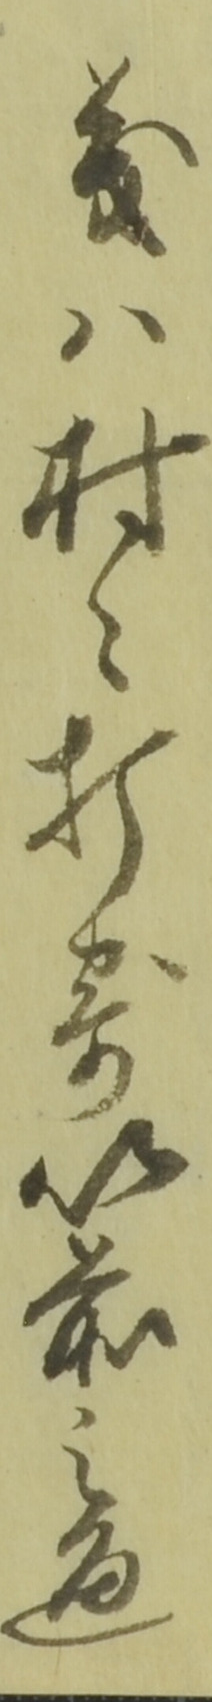義ハ村々打寄以前之通
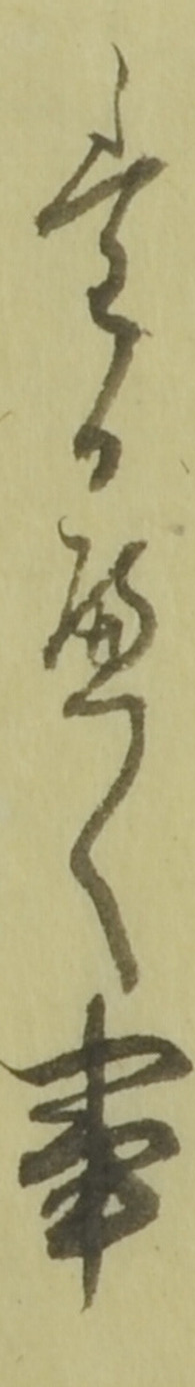たるへく事
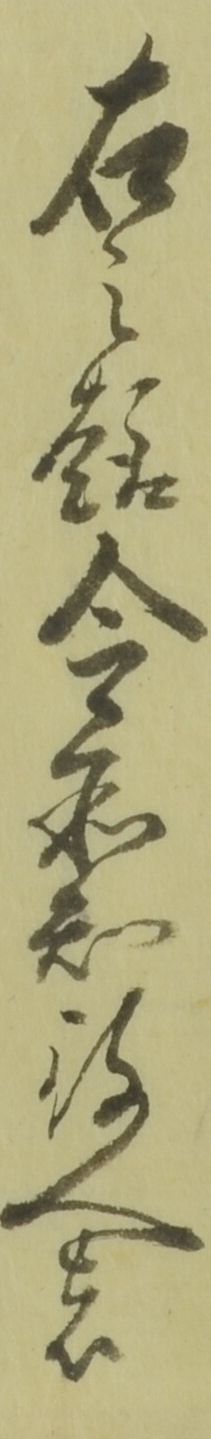右之趣令承知役人は
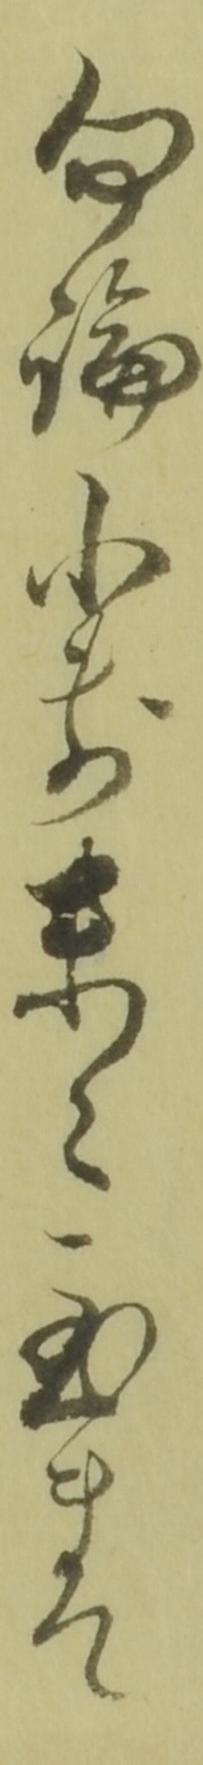勿論小前末々至まて
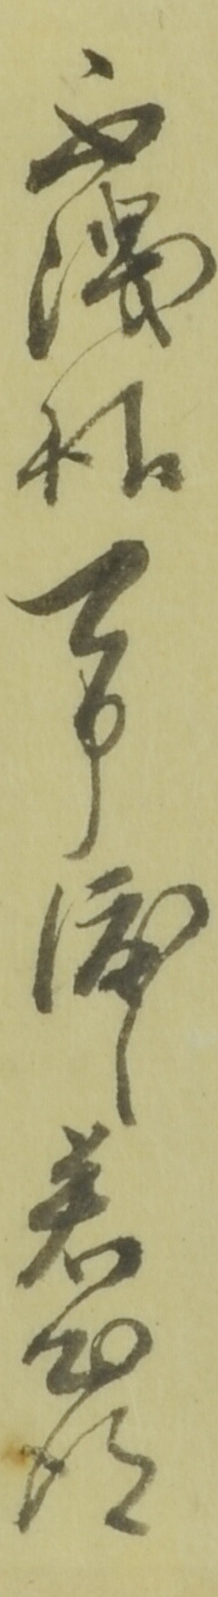不洩様可申渡候若心得
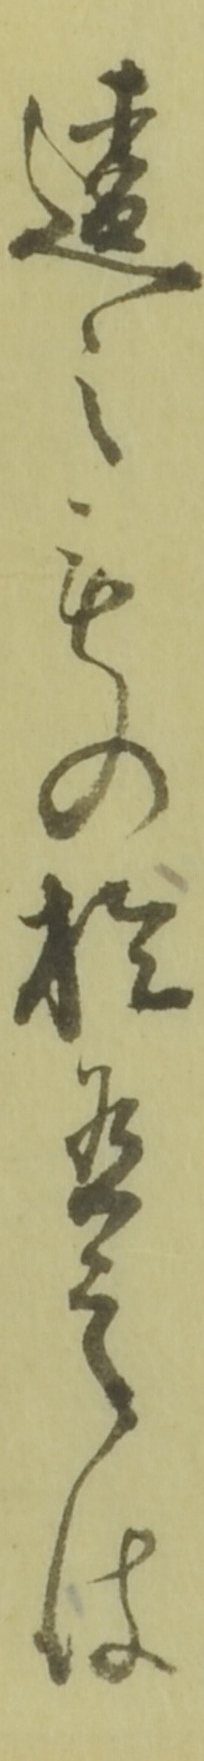違之もの於有之は
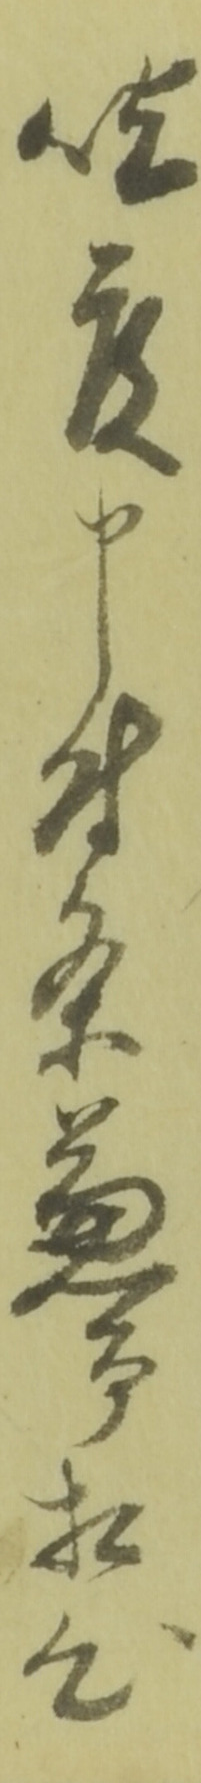屹度申付条兼而相心
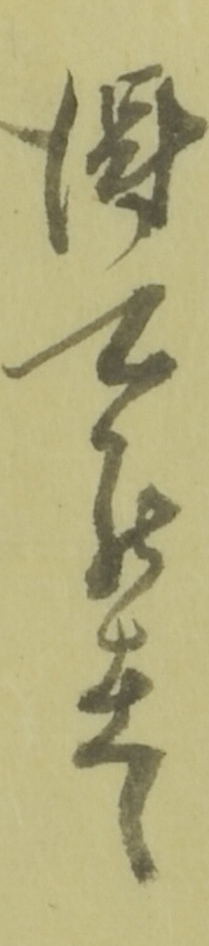得可罷在候
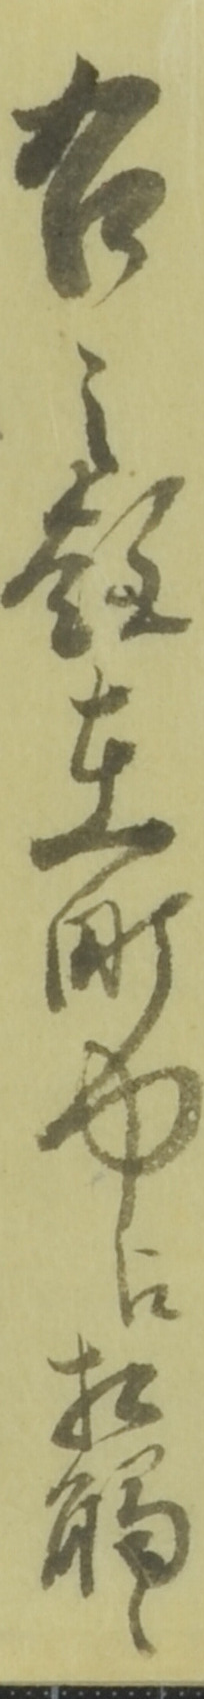右之趣在町中江相触候
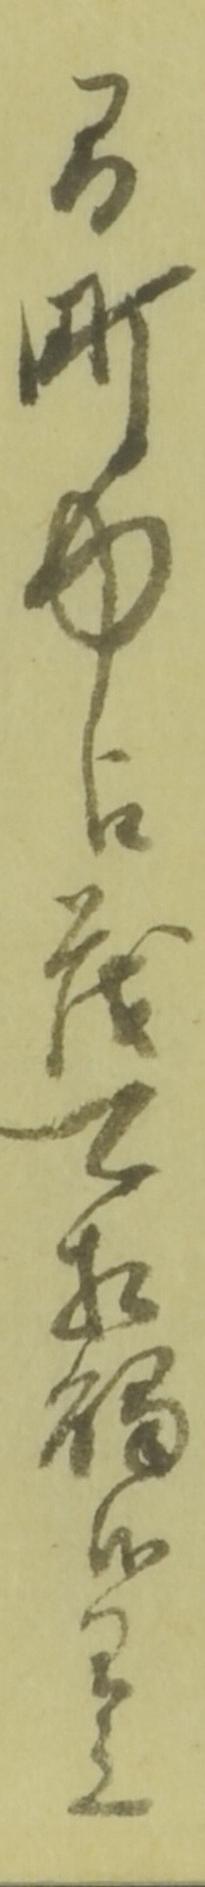間町中江も可相触候已上

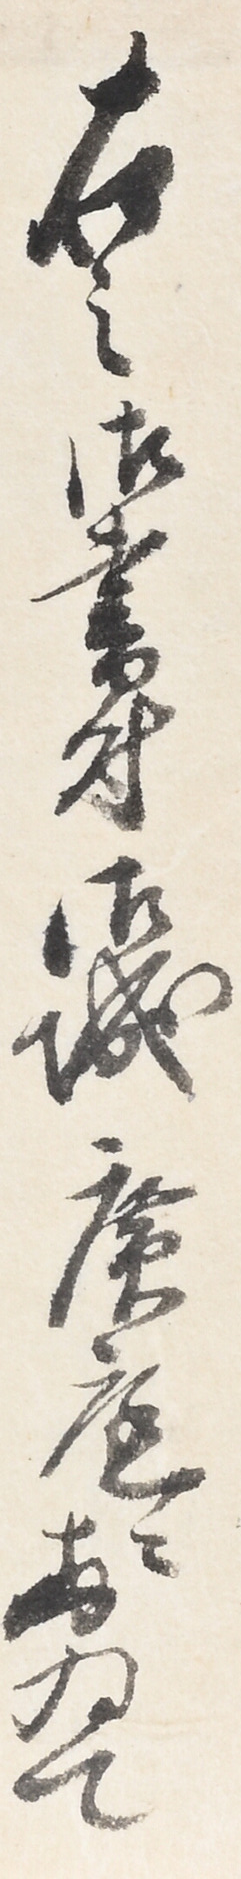右之御書付御城広庭ニおゐて
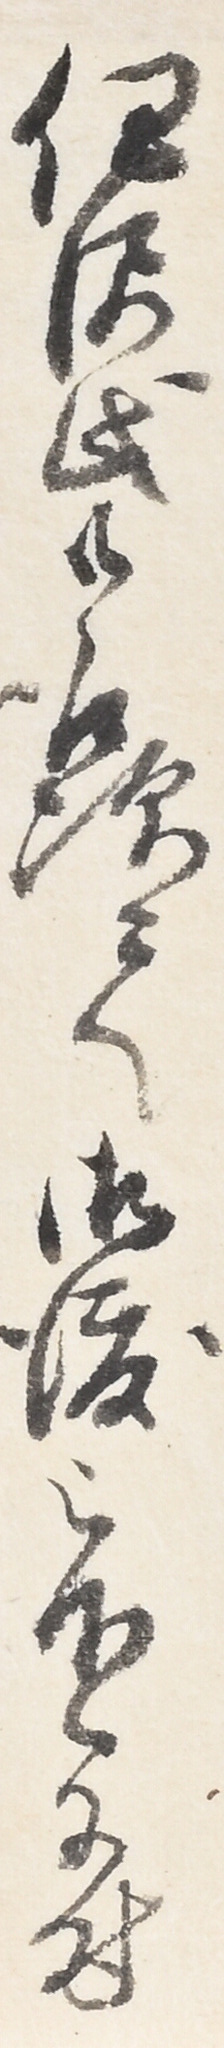伊沢氏御取次ニて御渡被下候に付
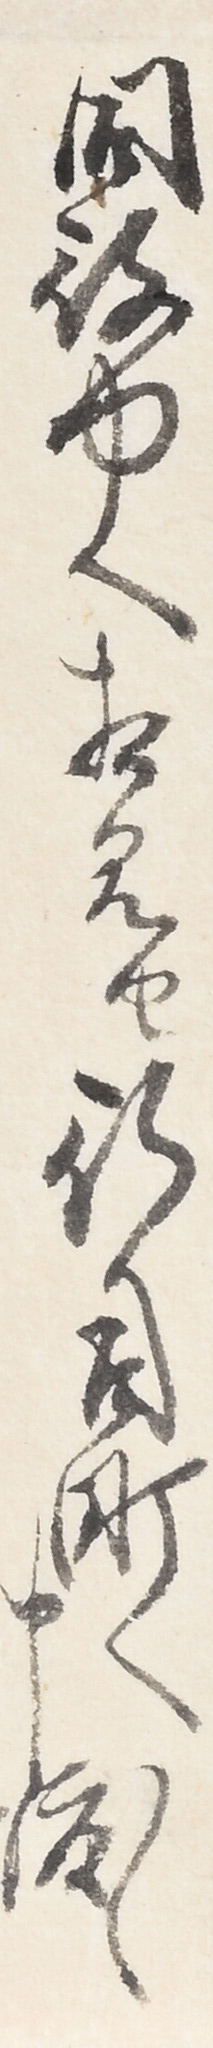同役中へ相見セ行司町へ申渡候
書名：御触書御書附控
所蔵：伊那市立高遠町図書館・合同会社AMANE
